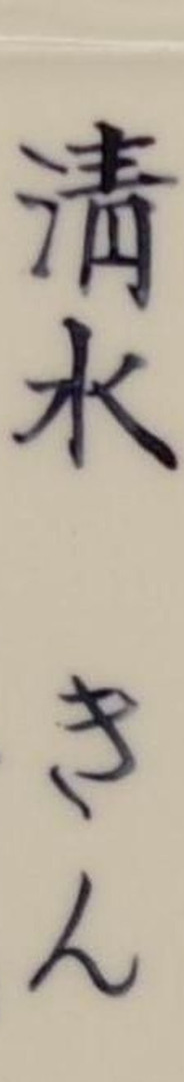清水きん
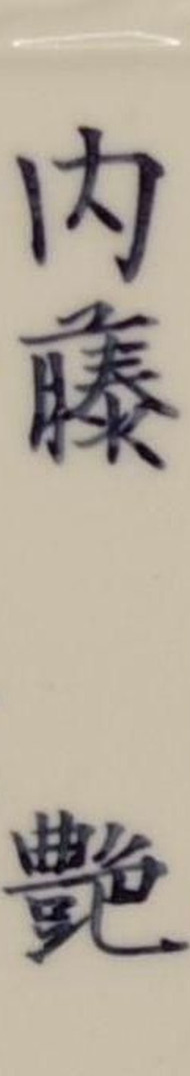内藤艶
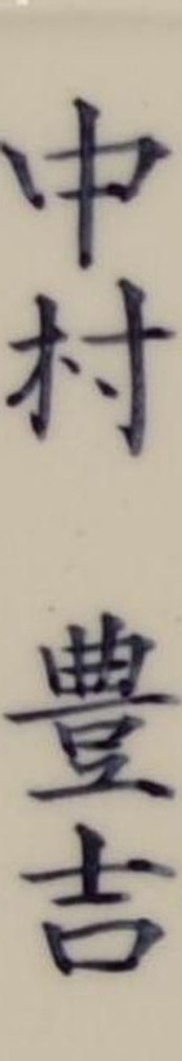中村豊吉
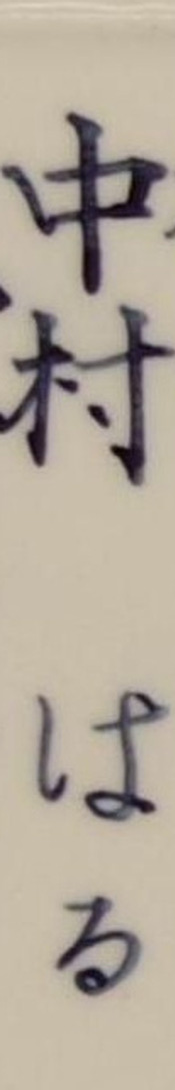中村はる
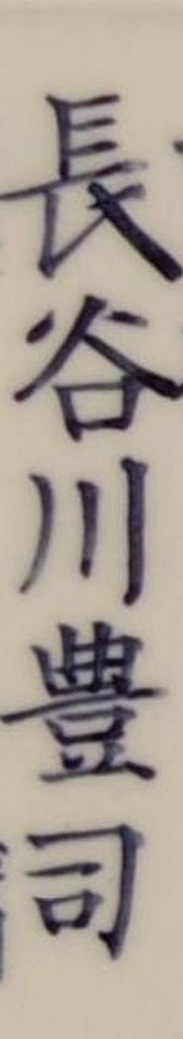長谷川豊司
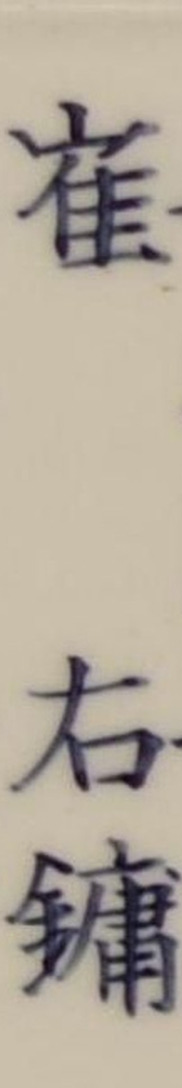雀右鶏
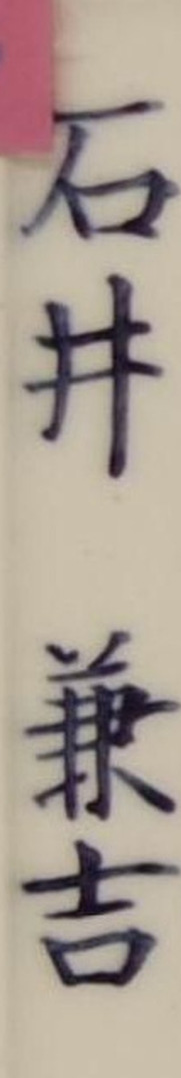石井兼吉

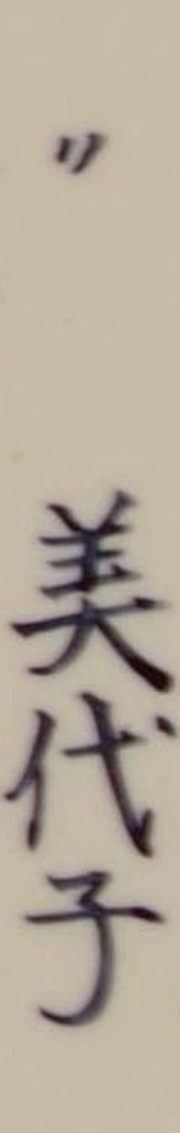美代子
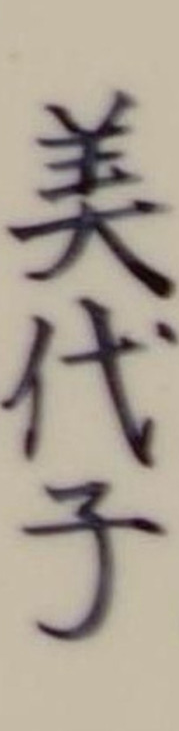美代子
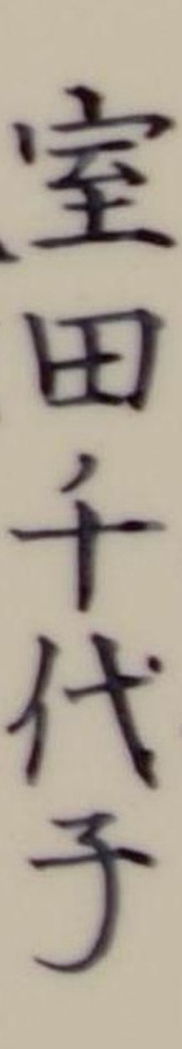室田千代子
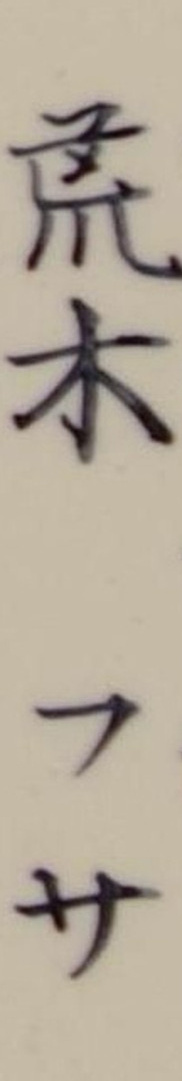荒木フサ
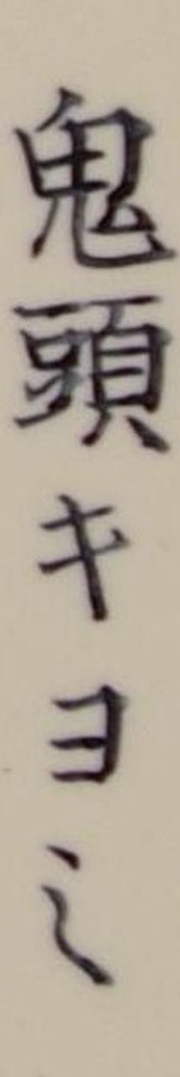鬼頭キヨミ
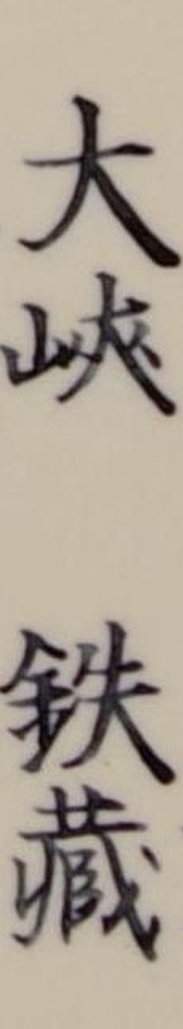大峡鉄蔵
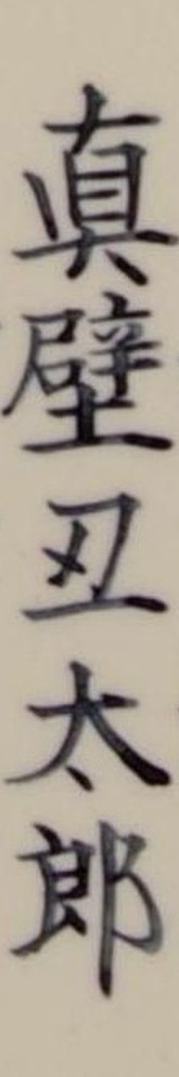真壁丑太郎
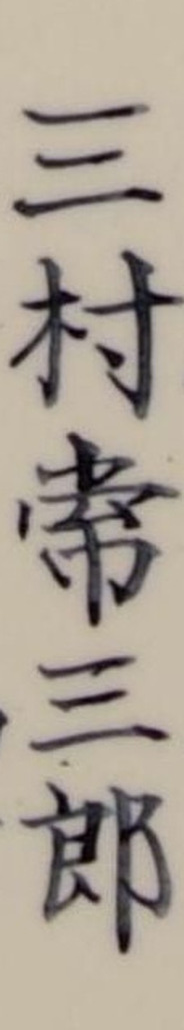三村常三郎
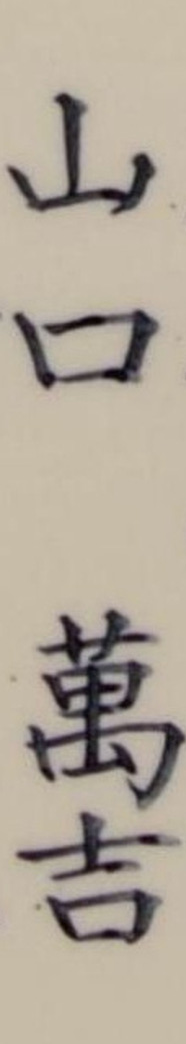山口萬吉
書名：M~S
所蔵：高野山金剛峯寺
